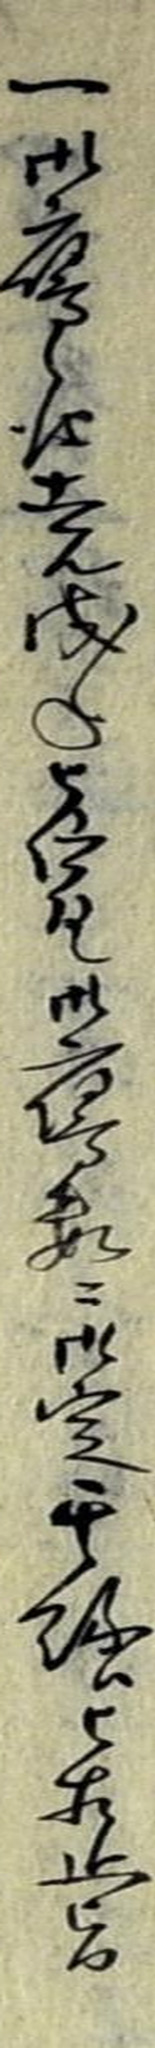一御鷹之儀去る戌年被仰付候御鷹数に御定其余は被相止旨
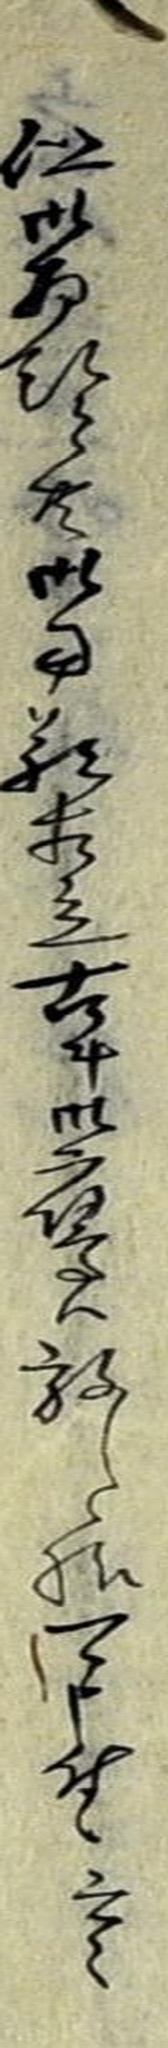但御拝領候共御用難相立古ゐ御鷹は放し候様可申付候云々
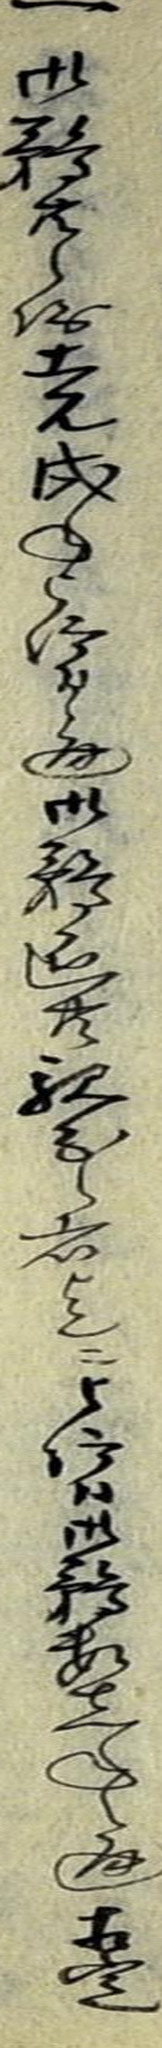一御鵜共之儀去る戌年被仰付候通御鵜匠共親分之者迄に被仰付御鵜数先年之通相定
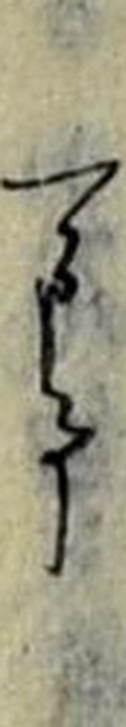可申事
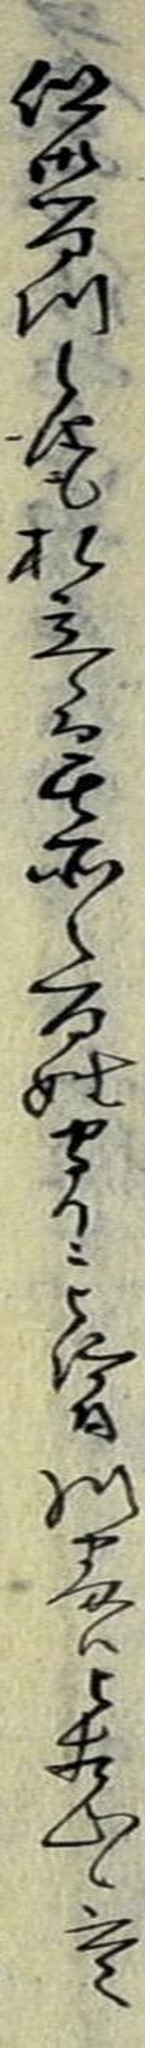但御留川之儀も札立候而其所之百姓守りに被仰付川番は被相止候云々
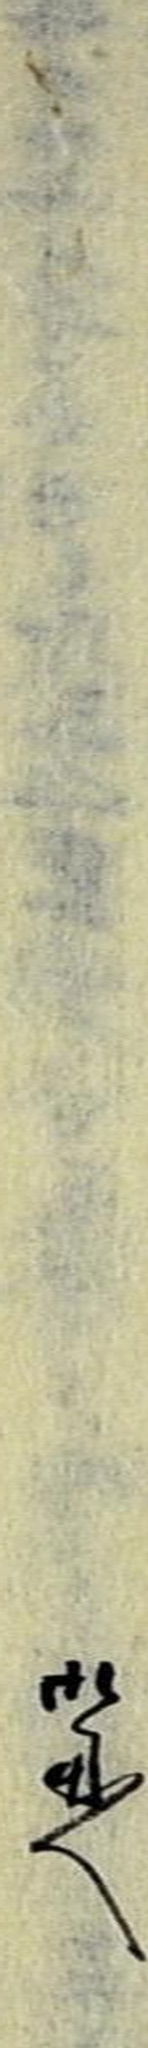御用人
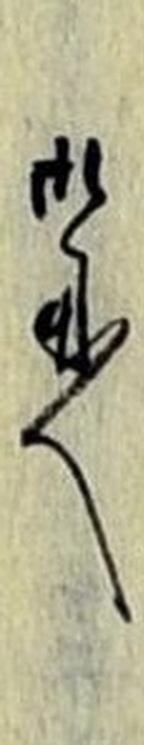御用人
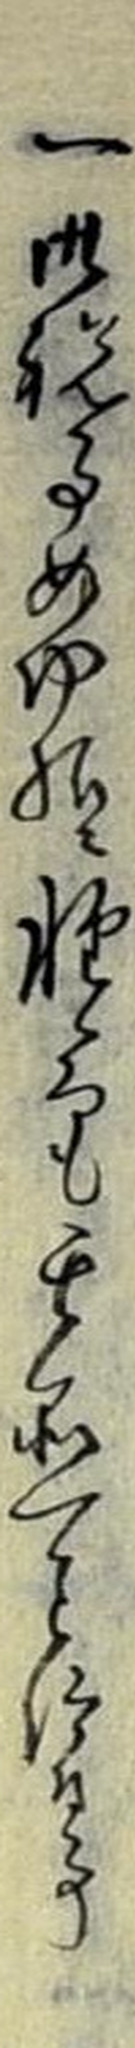一御祝事如何様に軽候而も其品可被仰付事
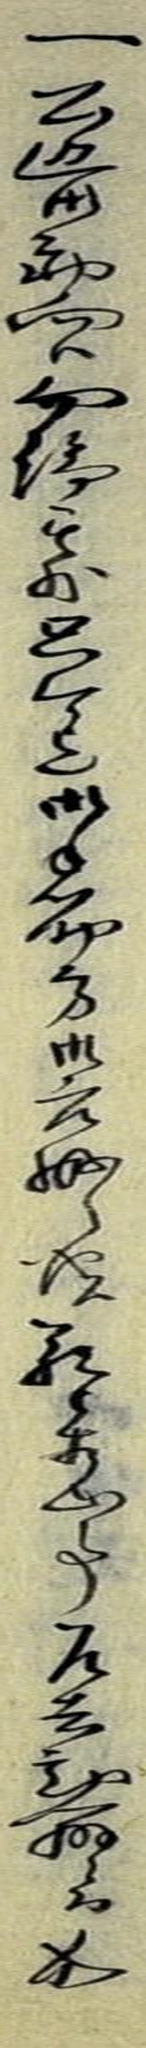一公辺御勤向は勿論其外只今迄御手筋方御取扱之儀は難被相止事乍去勘弁候而成
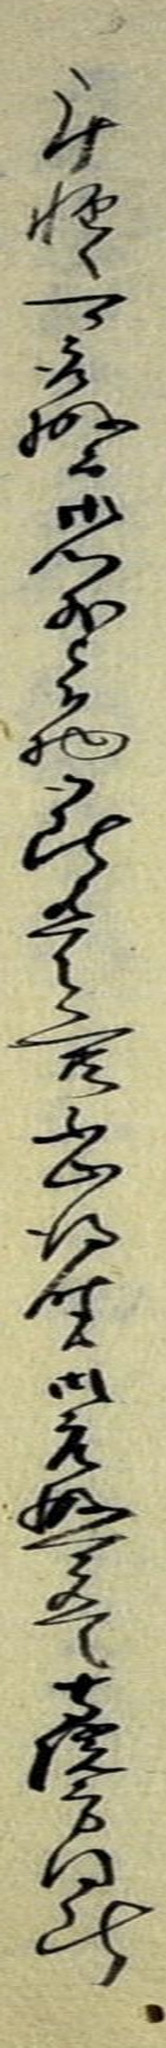たけ軽く可取扱候而御門外被下物御断有之候へ共不止得時は御取扱可有之寺院方同断
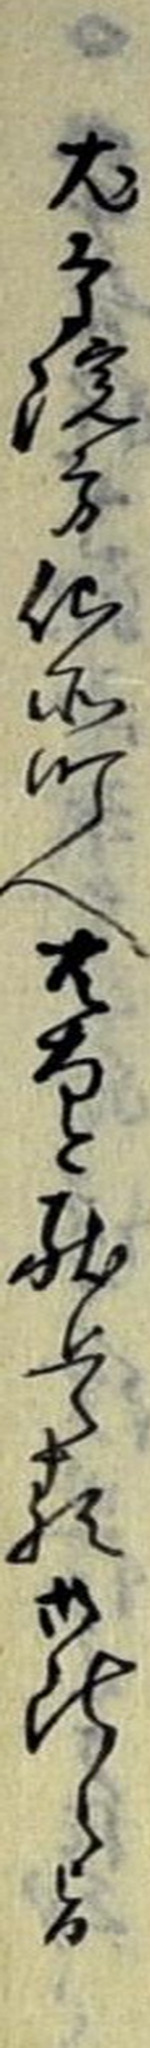尤寺院方他所町人共なと献上之類御断之旨
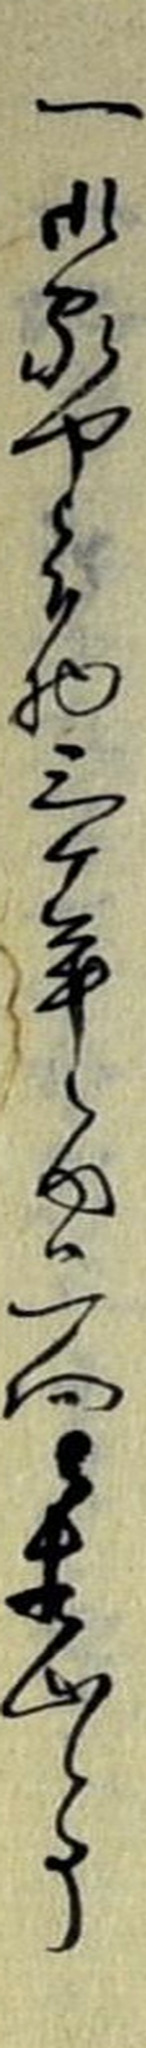一御家中被下物三ヶ年之内は一向被相止事
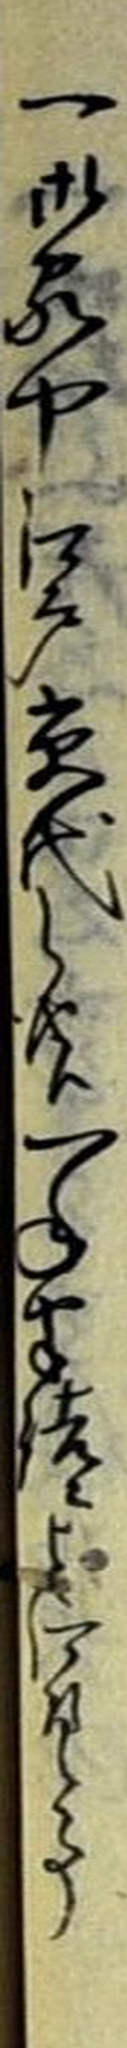一御家中江戸交代之儀は一年半詰に被仰付候事
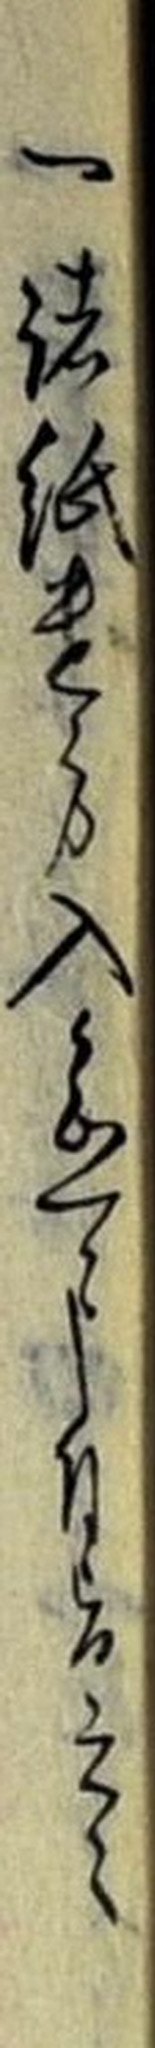一諸紙遣方入念可申付旨云々
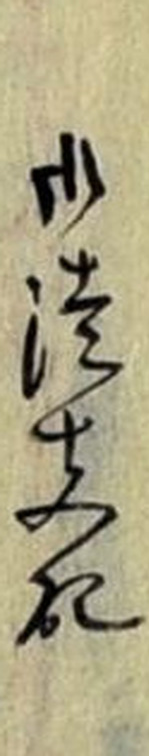御徒支配
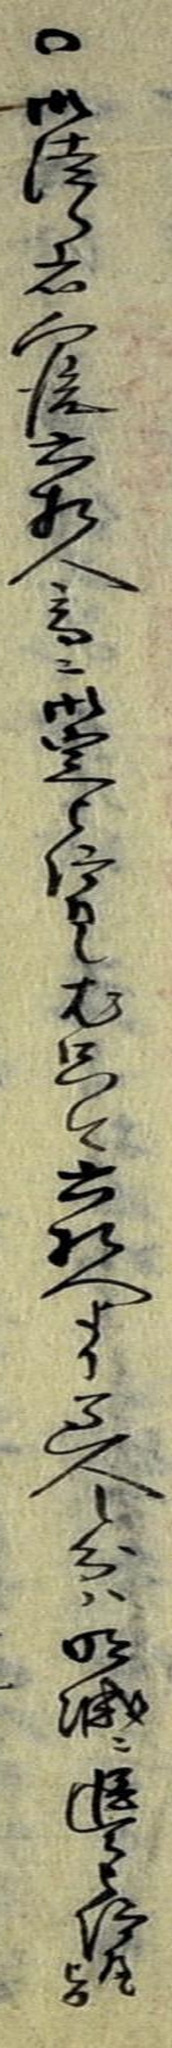〇御徒之者向後六拾人高に御定被仰付候尤只今六拾人より過人之分は明減に追而被仰付候旨
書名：命令之部 二
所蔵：福井県文書館 Fukui Prefectural Archives
